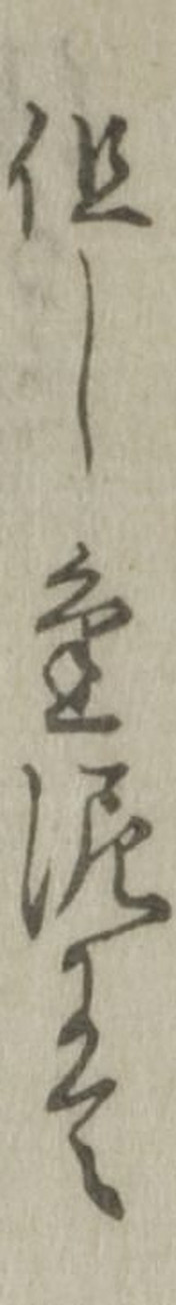但し金泥にて
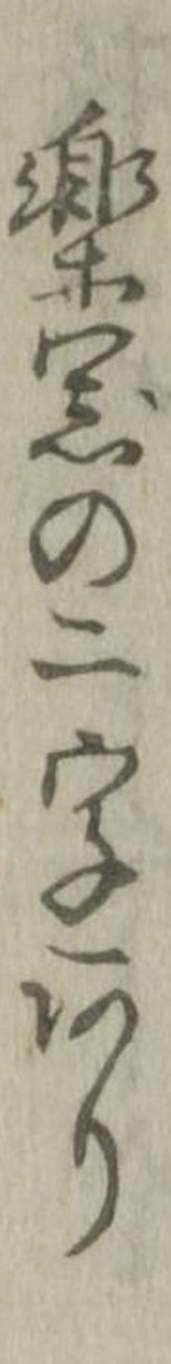樂器の二字あり
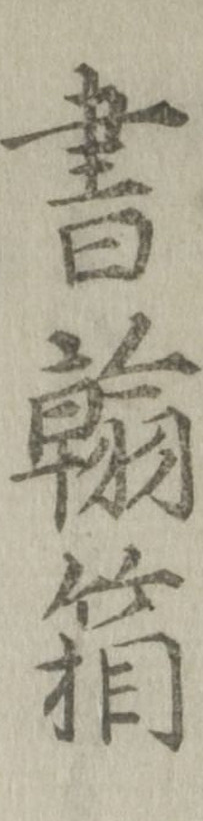書翰箱
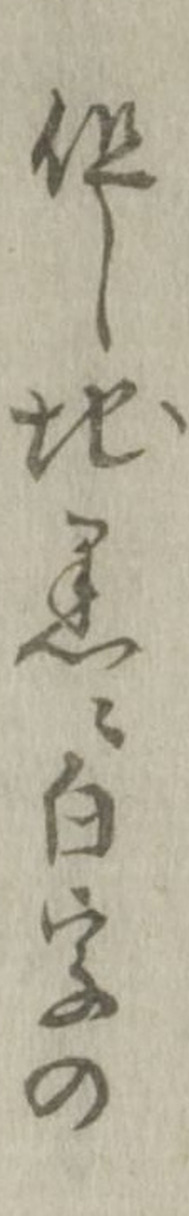但し地黒に白字の
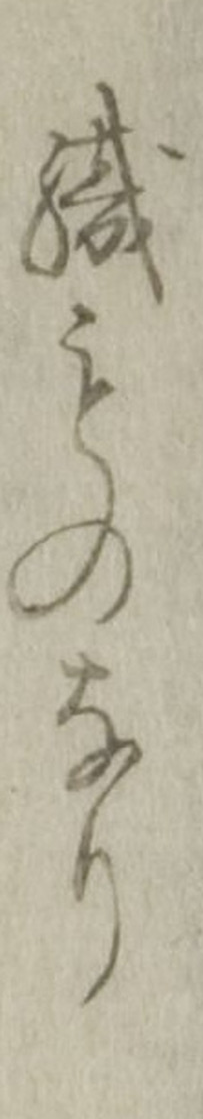織ものなり

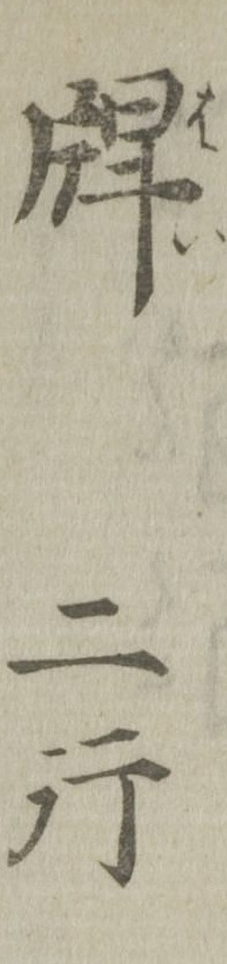牌二行
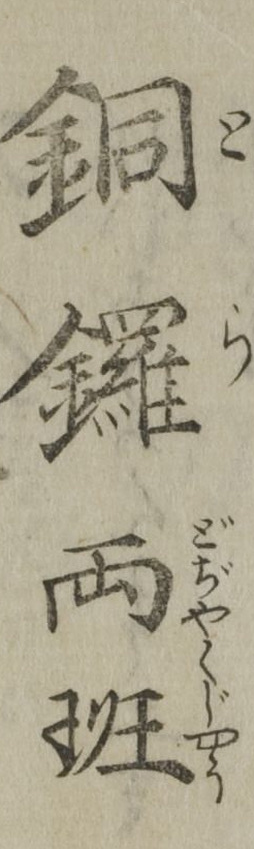銅鑼両班
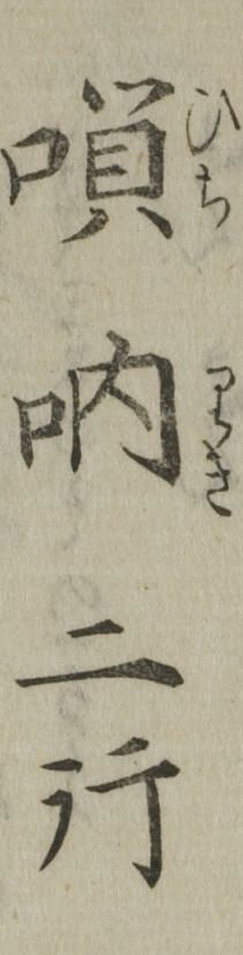嗩吶二行
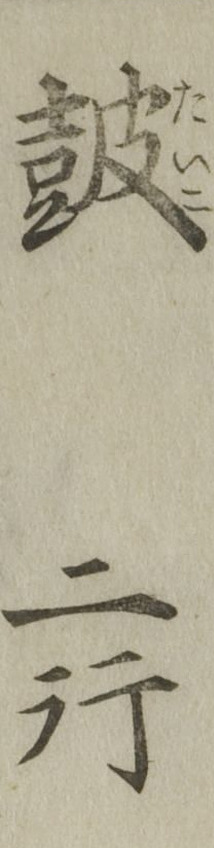鼓二行

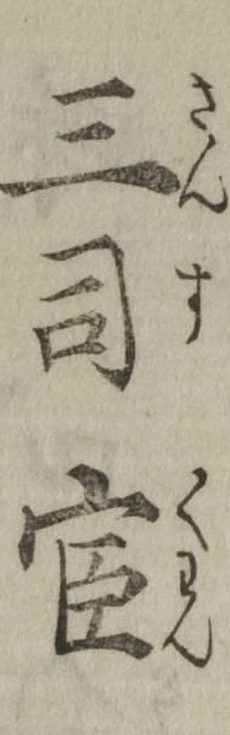三司宦
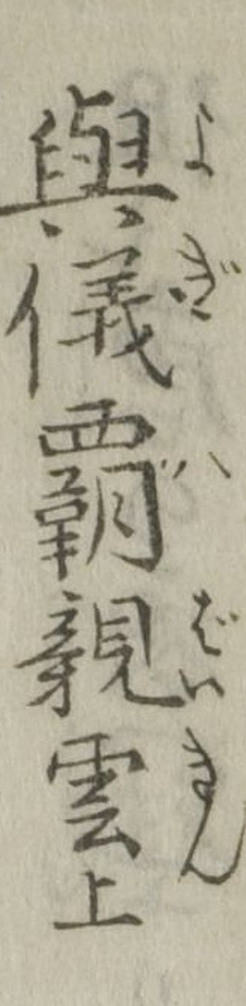與儀覇親雲上
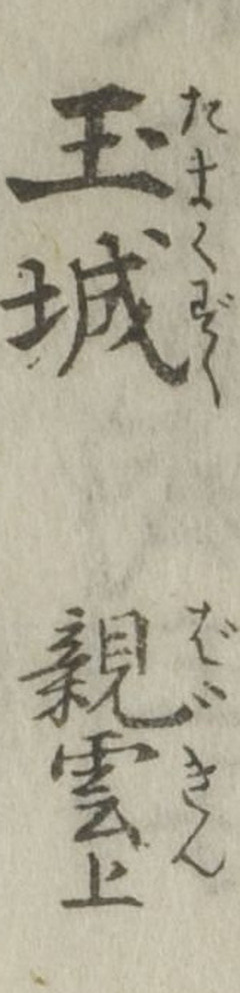玉城親雲上
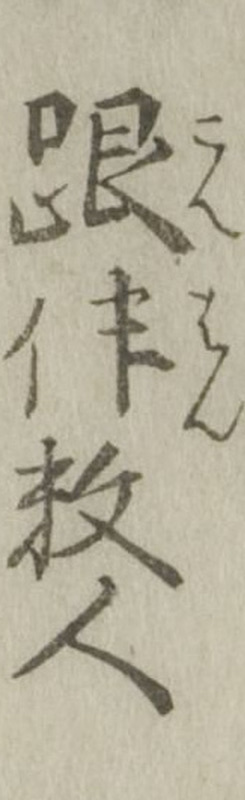跟伴数人

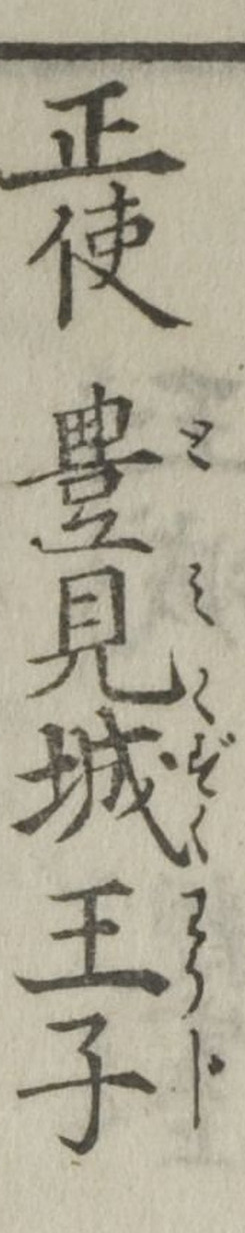正使豊見城王子
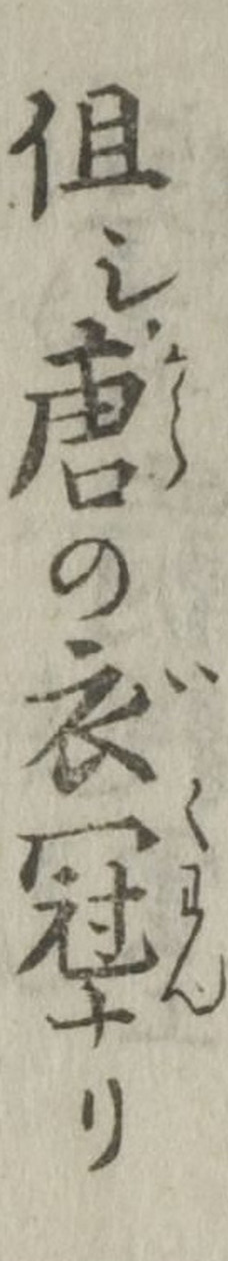但唐の衣冠ナリ
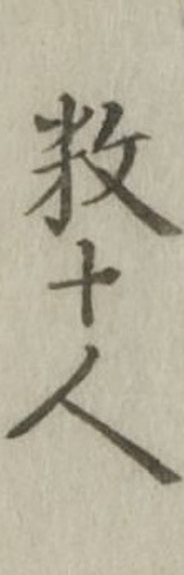数十人
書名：琉球人行列記 天保3年
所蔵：University of the Ryukyus Library
